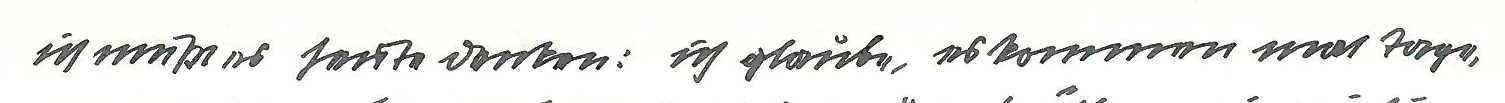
ich mußt es heute denken: ich glaube, es kommen noch Tage,
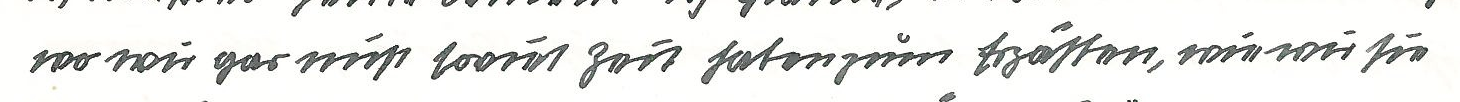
wo wir gar nicht soviel Zeit haben zum Erzählen, wie wir sie
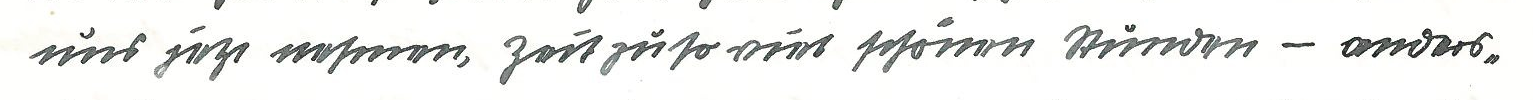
uns jetzt nehmen, Zeit zu so viel schönen Stunden – anders¬
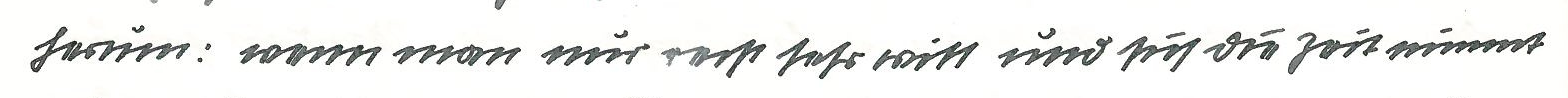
herum: wenn man nur recht sehr will und sich die Zeit nimmt
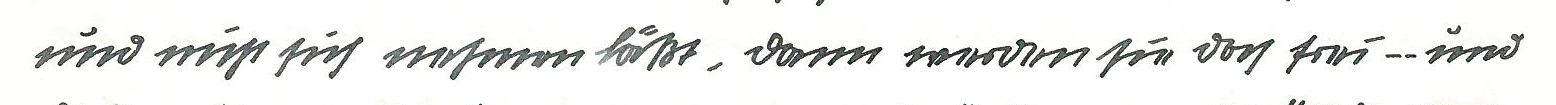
und nicht sich nehmen läßt, dann werden sie doch frei – – und
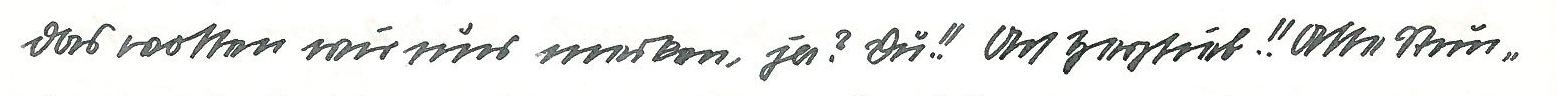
das wollen wir uns merken, ja? Du!! Ach Herzlieb!! Alle Stun¬
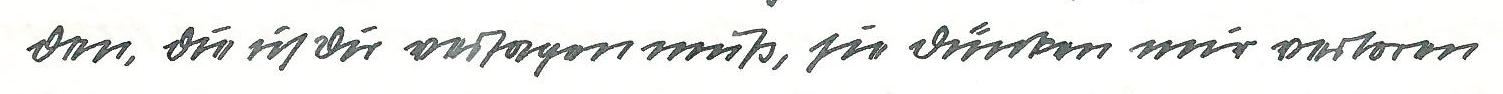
den, die ich Dir versagen muß, sie dünken mir verloren
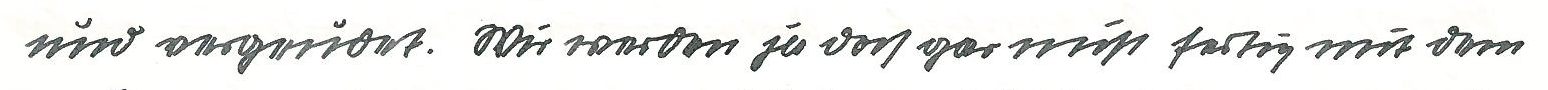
und vergeudet. Wir werden ja doch gar nicht fertig mit dem
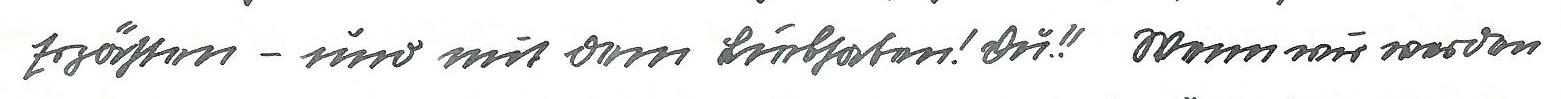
Erzählen – und mit dem Liebhaben! Du!! Wenn wir werden
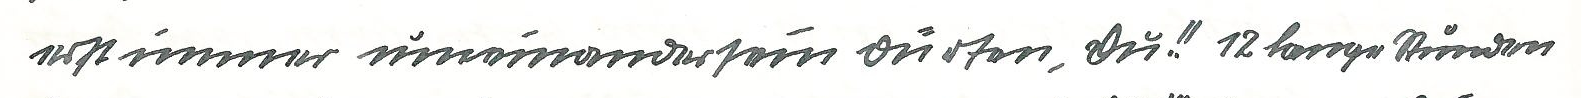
erst immer umeinandersein dürfen, Du!! 12 lange Stunden
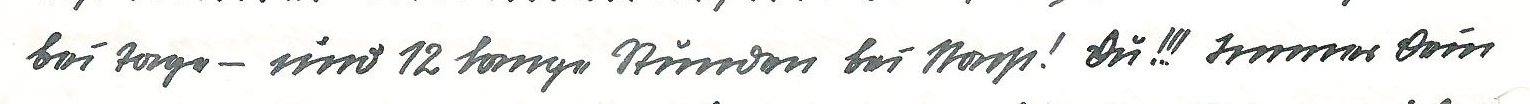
bei Tage – und 12 lange Stunden bei Nacht! Du!!! Immer Dein
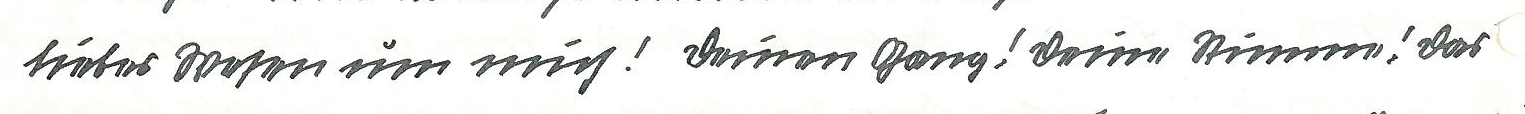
liebes Wesen um mich! Deinen Gang! Deine Stimme! Das
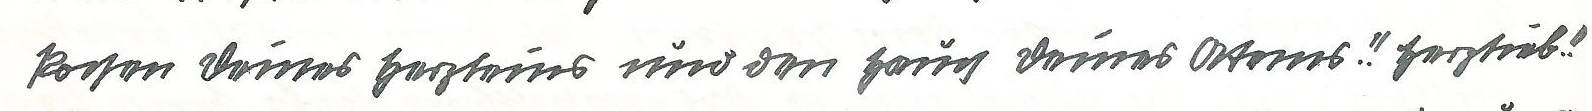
Pochen Deines Herzleins und den Hauc Deines Atems!! Herzlieb!!
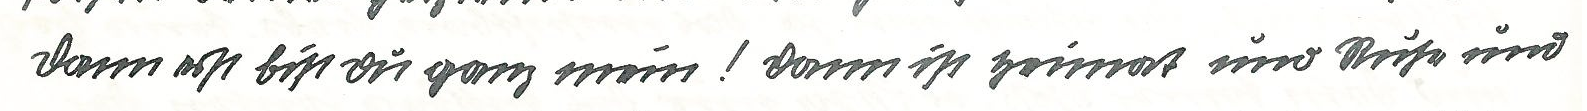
Dann erst bist Du ganz mein! Dann ist Heimat und Ruhe und
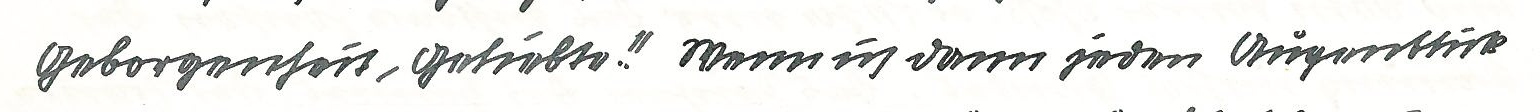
Geborgenheit, Geliebte!! Wenn ich dann jeden Augenblick
